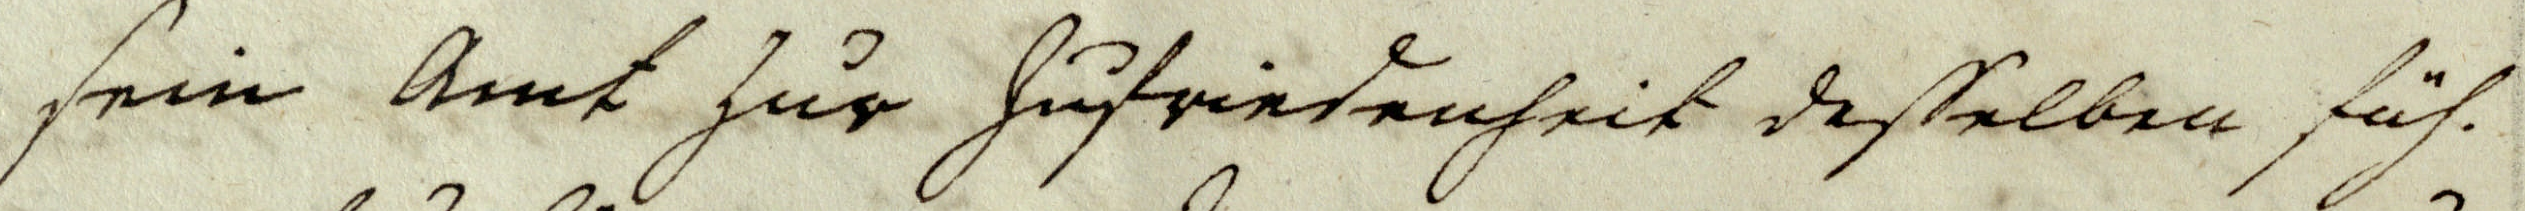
sein Amt zur Zufriedenheit desselben füh¬
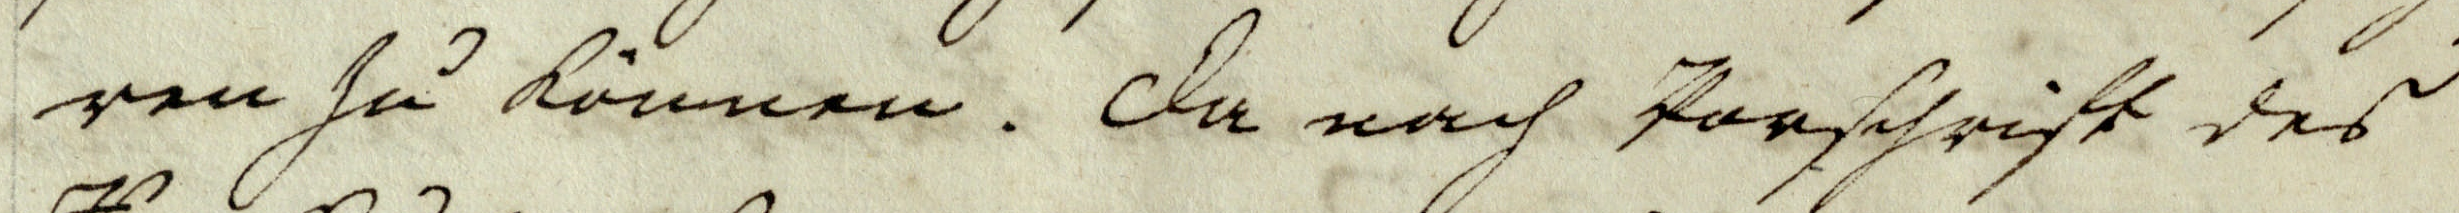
ren zu können. Da nach Vorschrift des
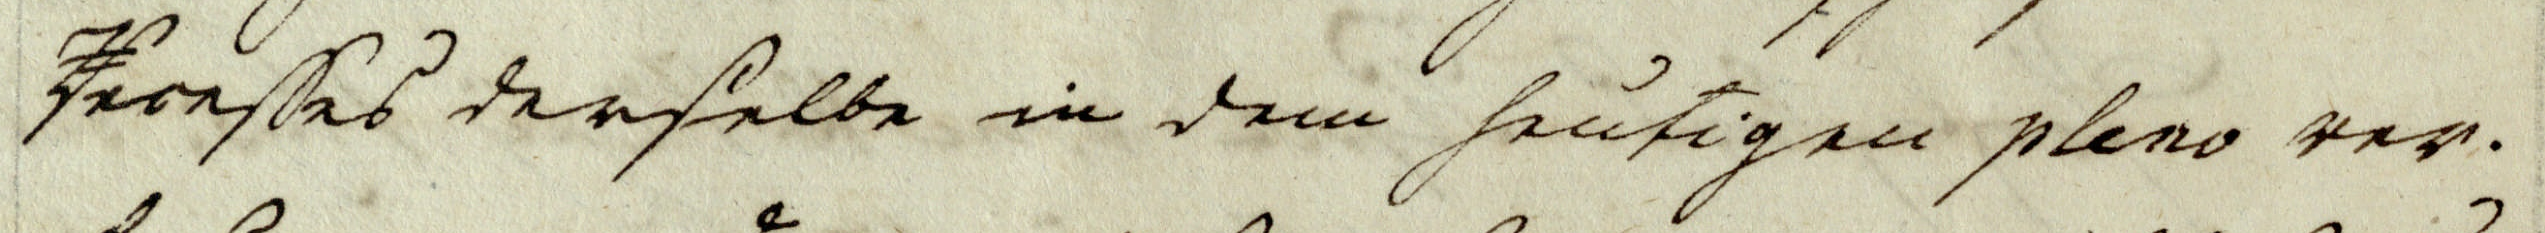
Recesses derselbe in dem heutigen pleno ver¬
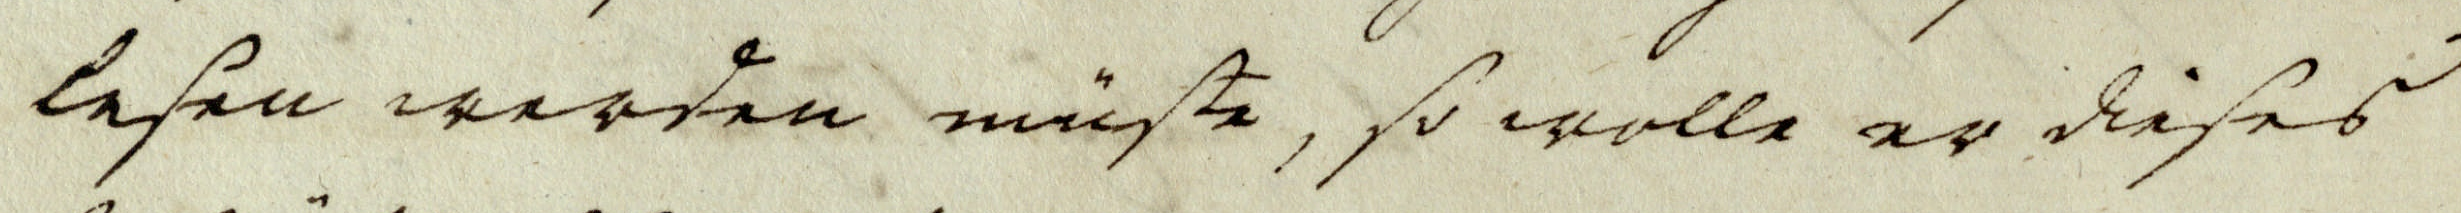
lesen werden müßte, so wolle er dises
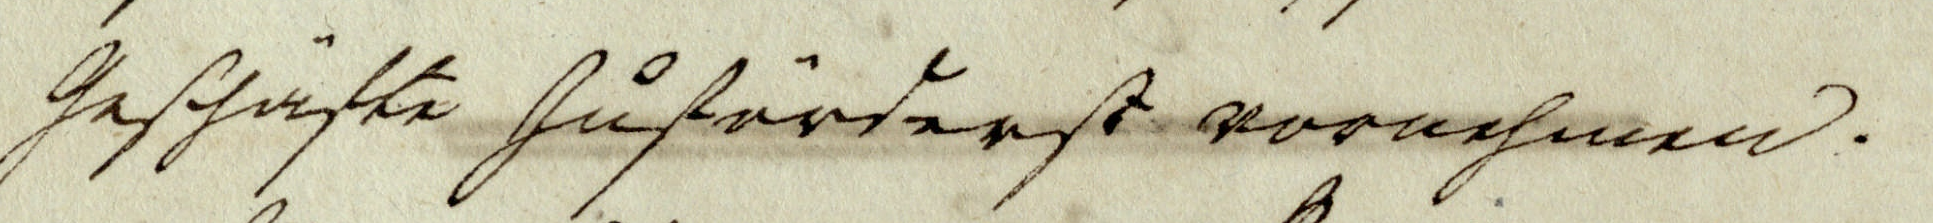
Geschäfte zuförderst vornehmen.
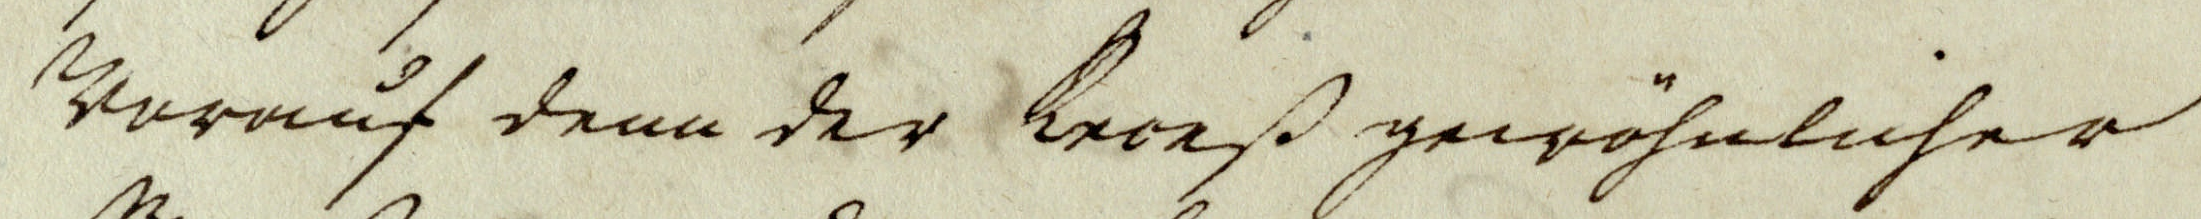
Worauf dann der Receß gewöhnlicher
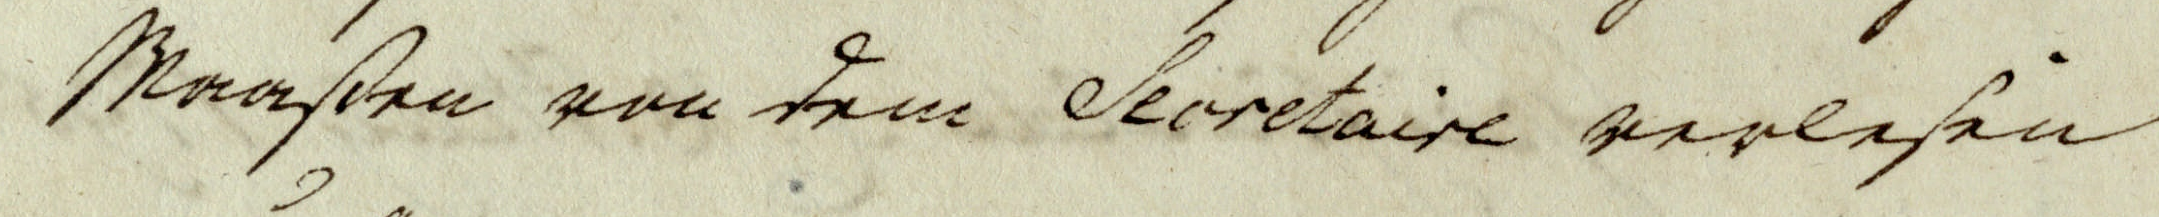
Maaßen von dem Secretaire verlesen
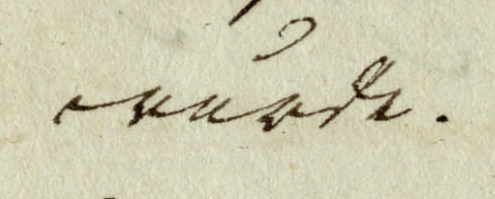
wurde.
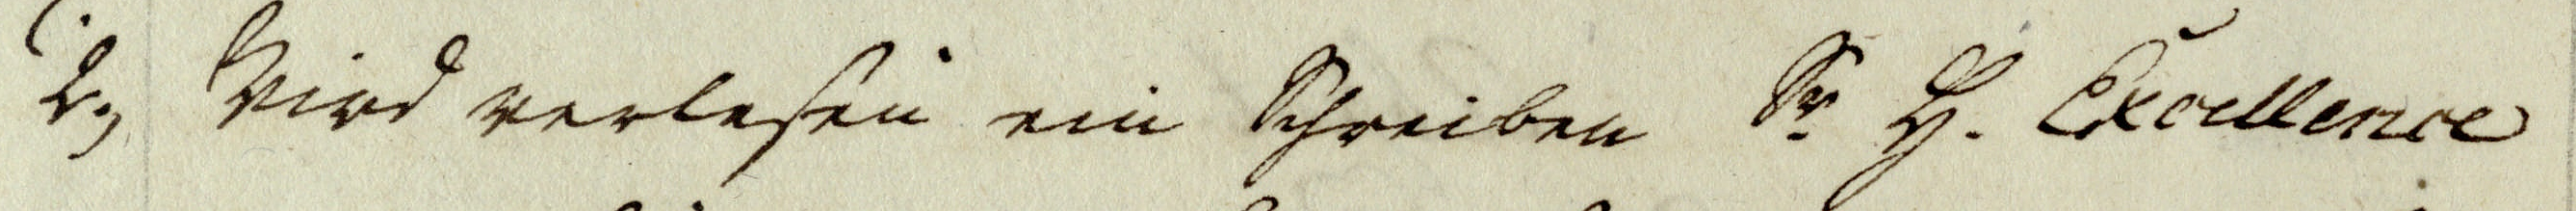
2. Wird verlesen ein Schreiben Sr. H. Excellence
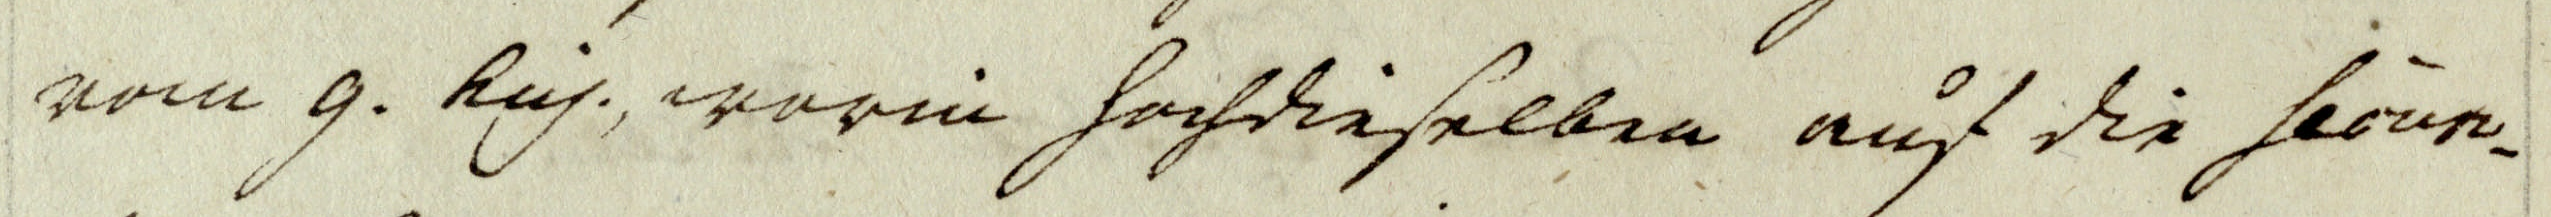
vom 9. huj., worin Hochdieselben auf die secun¬
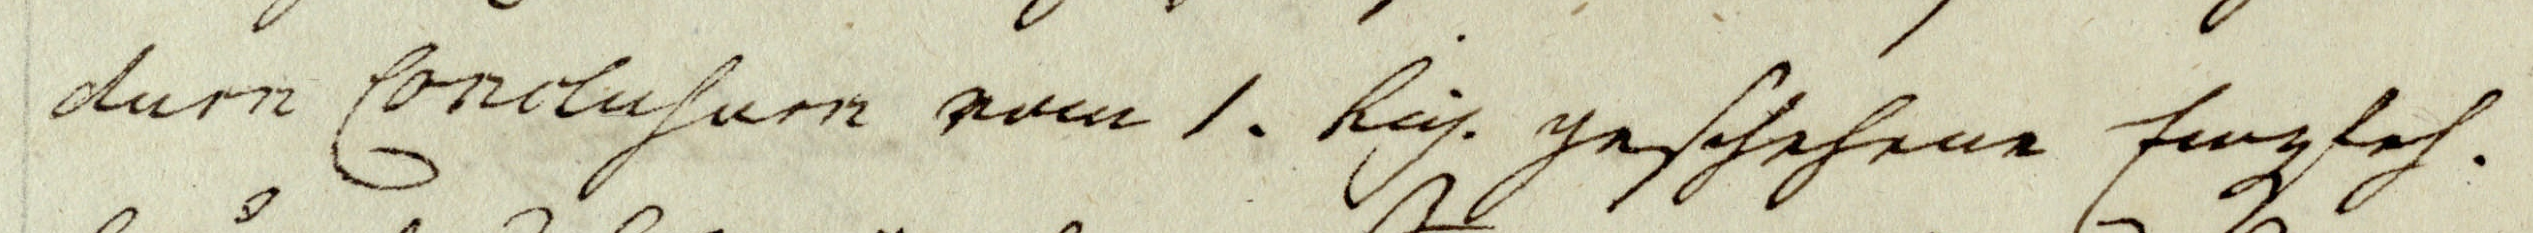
dum Conclusum vom 1. huj. geschehene Empfeh¬
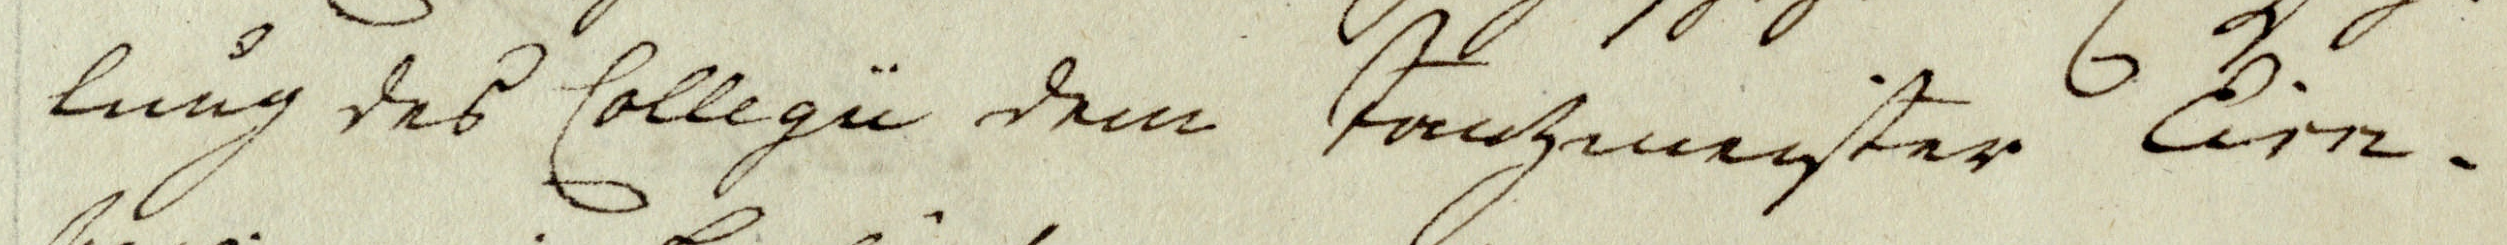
lung des Collegii dem Tanzmeister Eim¬
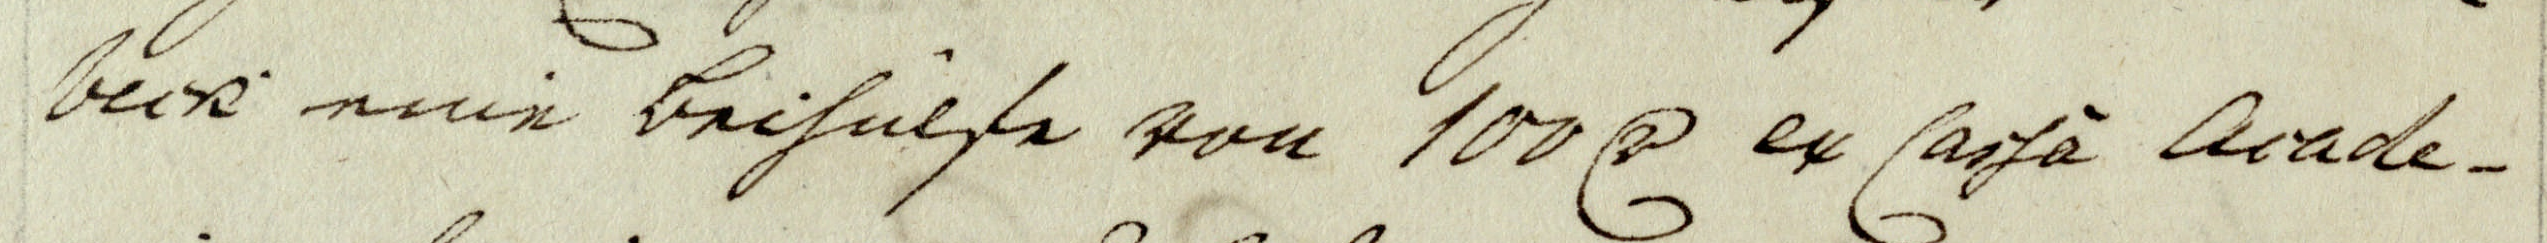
beck eine Beihülfe von 100 rtl. ex Cassa Acade¬
